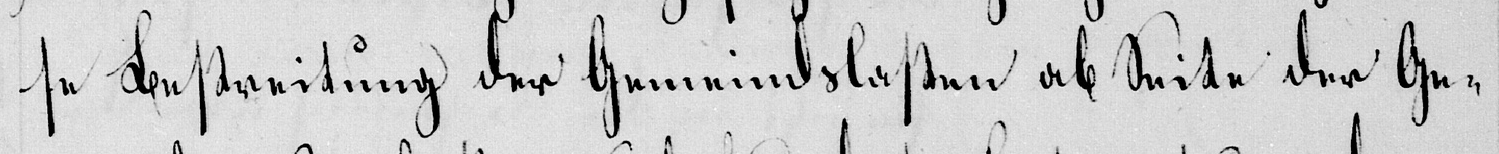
se Bestreitung der Gemeindslasten ab Seite der Ge¬
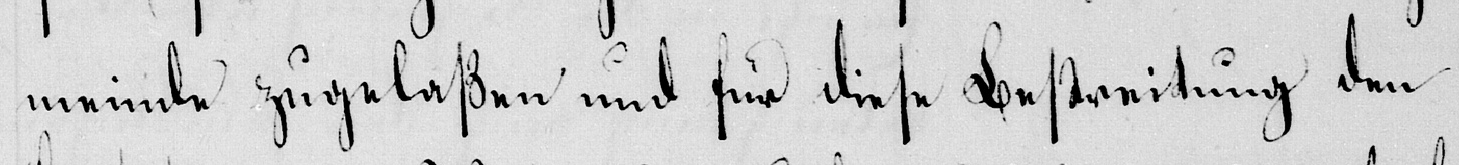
meinde zugelaßen und für diese Bestreitung den
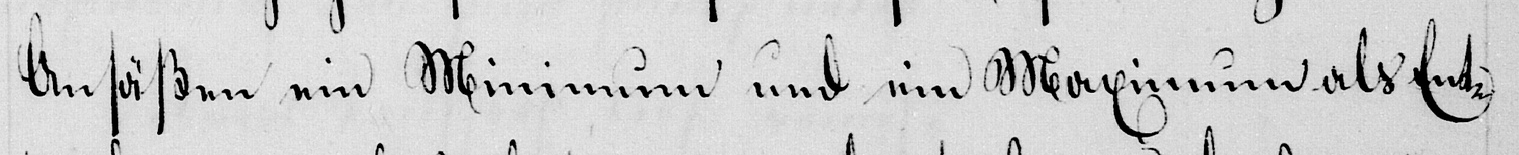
Ansäßen ein Minimum und ein Maximum als Ent¬
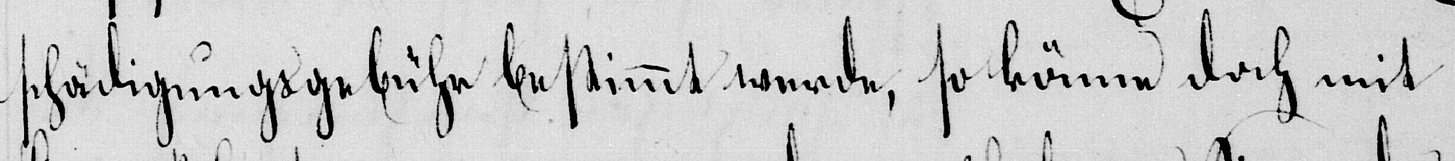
schädigungsgebühr bestimmt werde, so könne doch mit
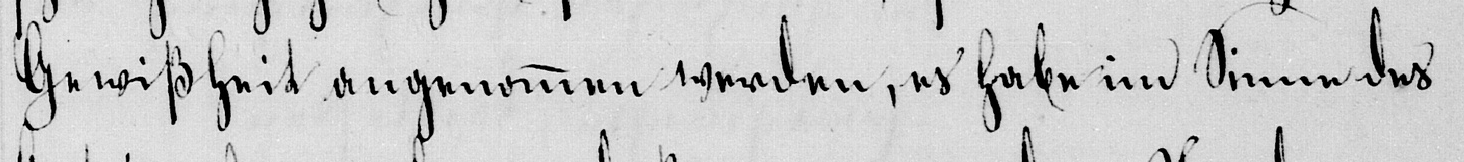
Gewißheit angenommen werden, es habe im Sinne des
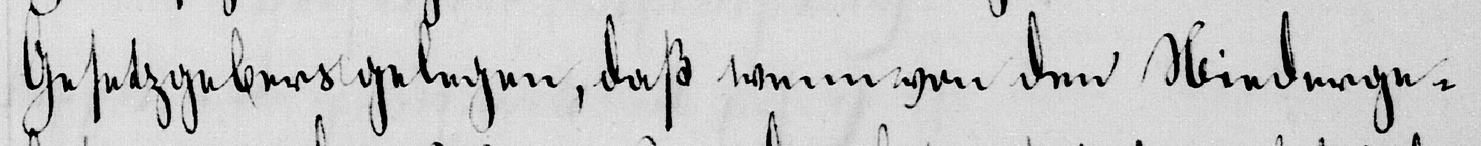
Gesetzgebers gelegen, daß wenn von den Niederge¬
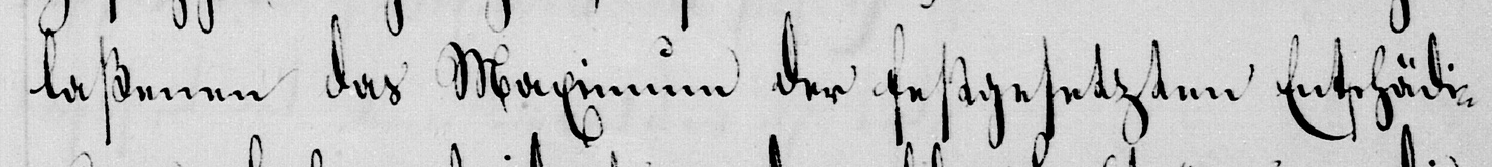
laßenen das Maximum der festgesetzten Entschädi¬
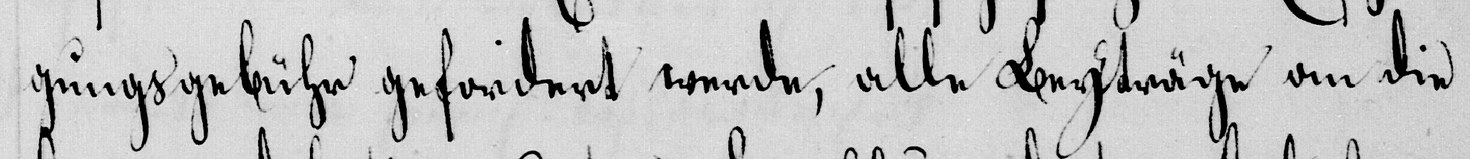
gungsgebühr gefordert werde, alle Beyträge an die
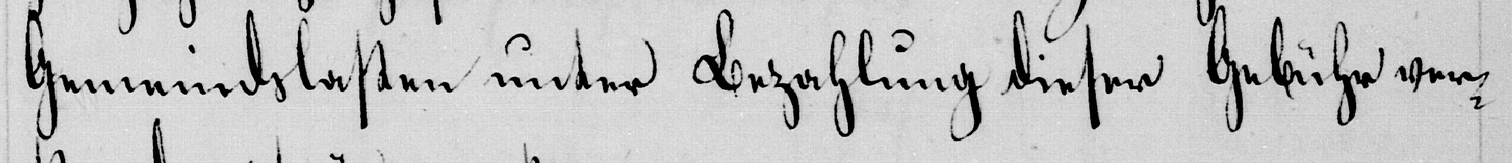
Gemeindslasten unter Bezahlung dieser Gebühr ver¬
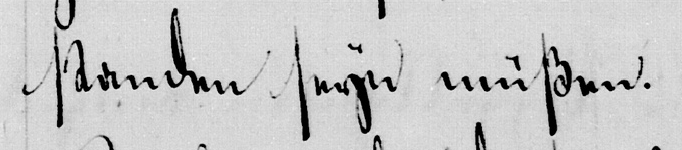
standen seyn müßen.
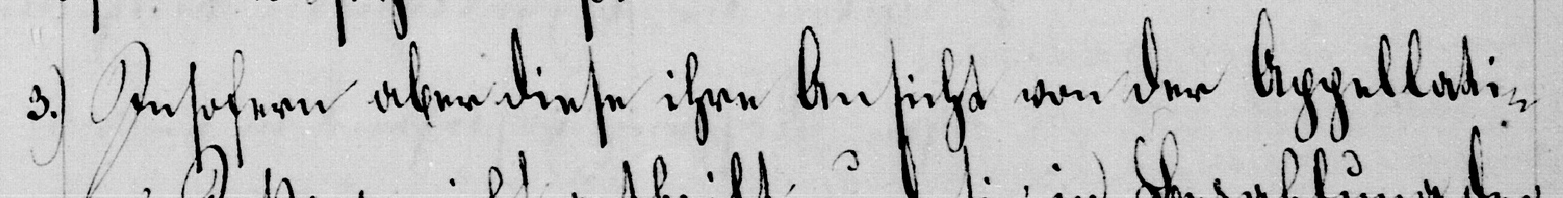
3.) Insofern aber diese ihre Ansicht von der Appellati¬
